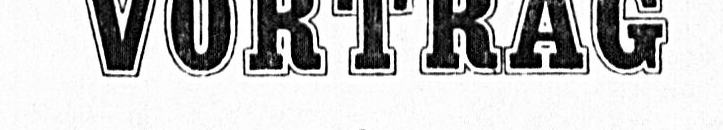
VORTRAG
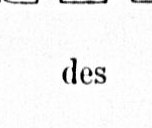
des
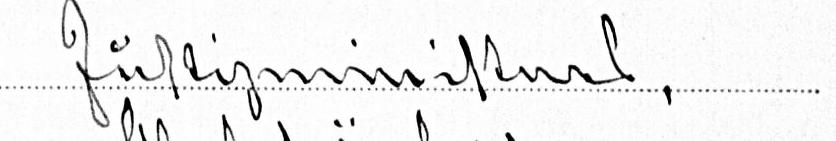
Justizministers,
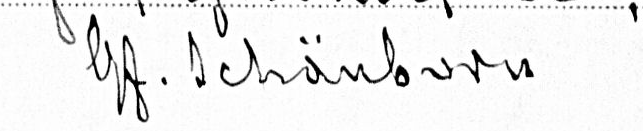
Gf. Schänborn
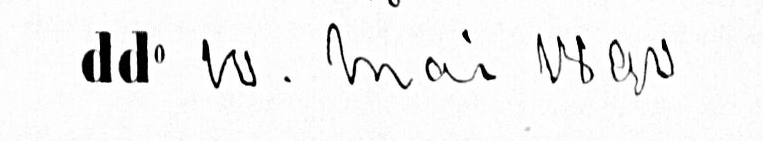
dd° 10. Mai 1890
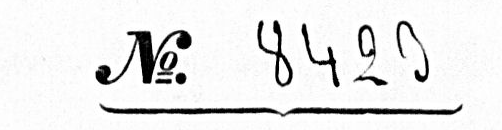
N° 8423
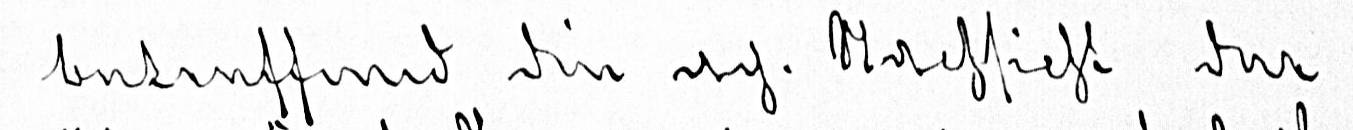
betreffend die ag. Nachsicht des
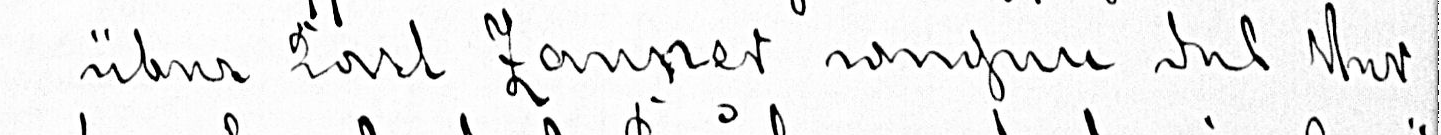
über Karl Zauner wegen des Vor¬
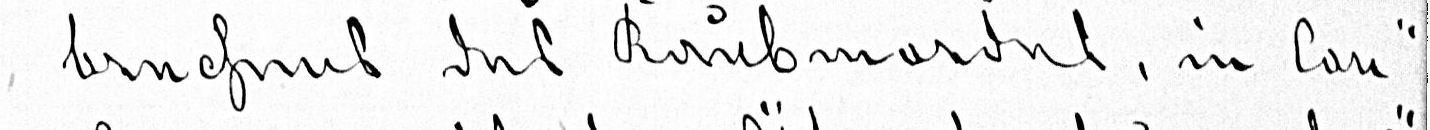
brechens des Raubmordes, in Con¬
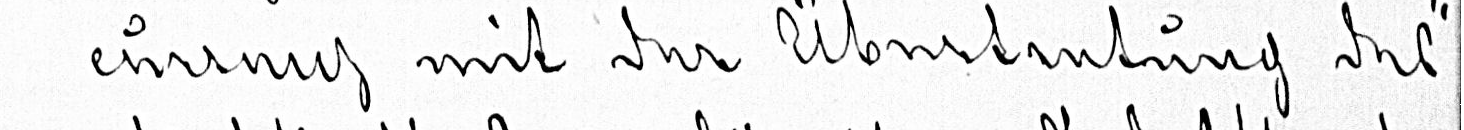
currens mit der Übertretung des
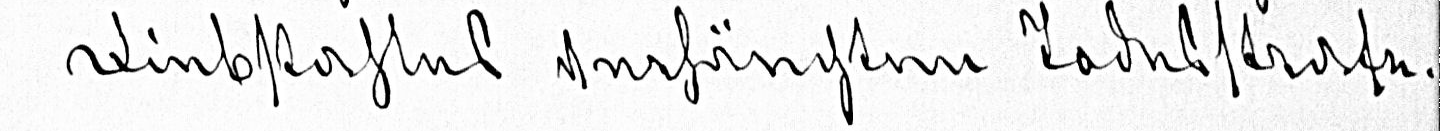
Diebstahles verhängten Todesstrafe.
